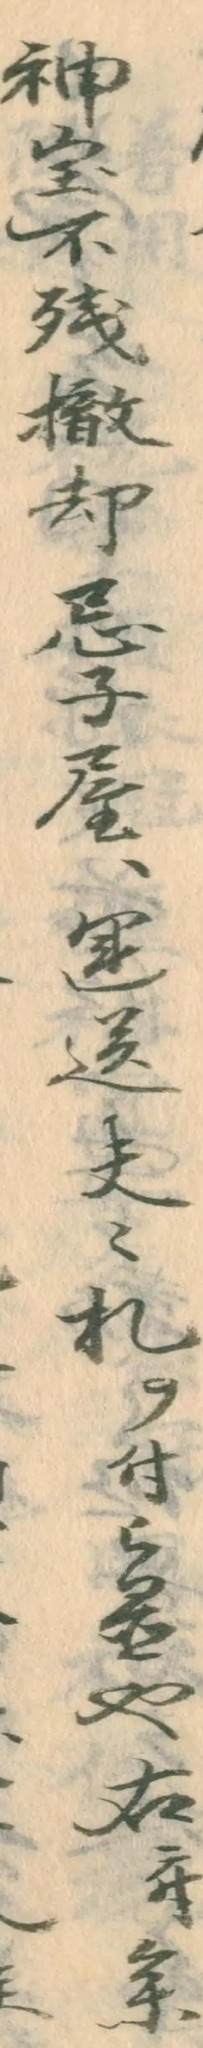神宝不残撤却忌子屋へ運送夫々札ヲ付被置也右ニ付参
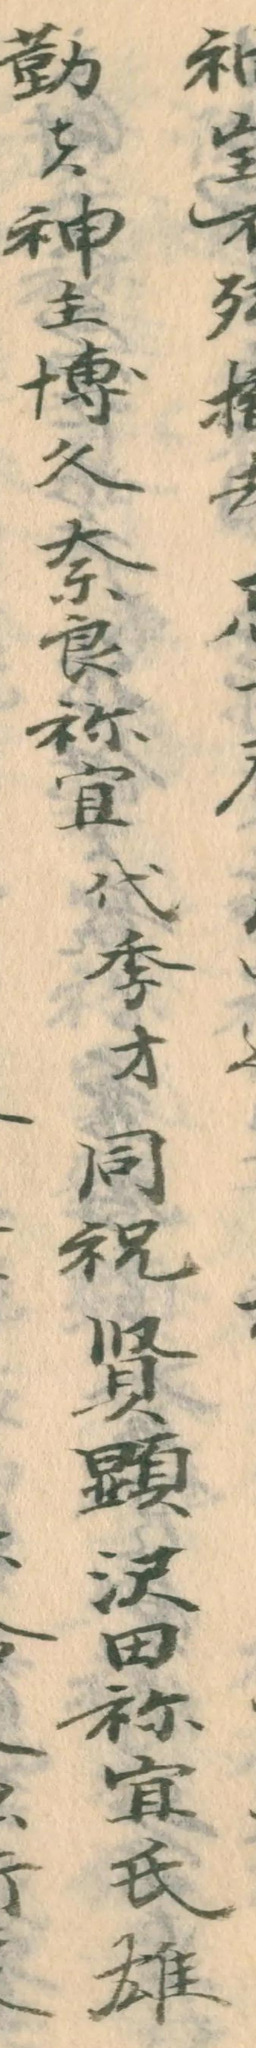勤は神主博久奈良祢宜代季才同祝賢顕沢田祢宜氏雄
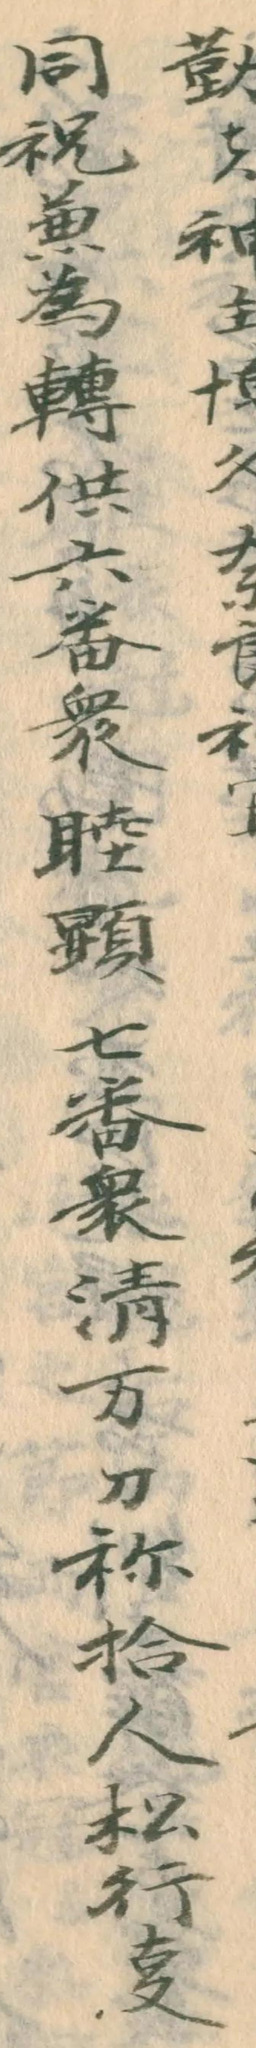同祝兼為転供六番衆睦顕七番衆清万刀祢拾人松行事
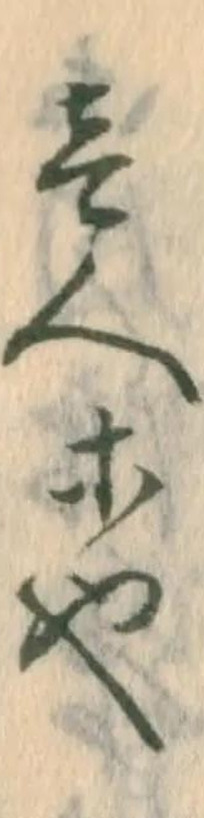壱人等也
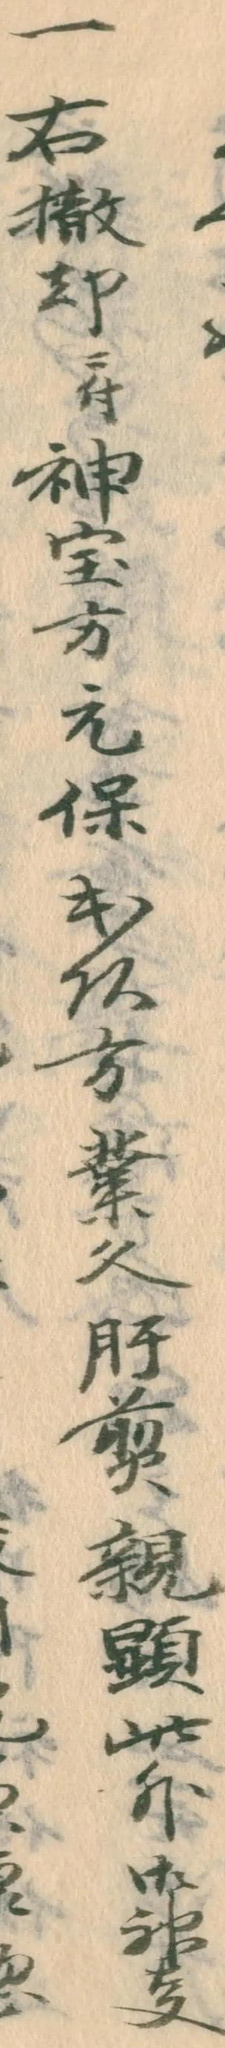一右撤却ニ付神宝方元保出頭方業久肝煎親顕此外御神事
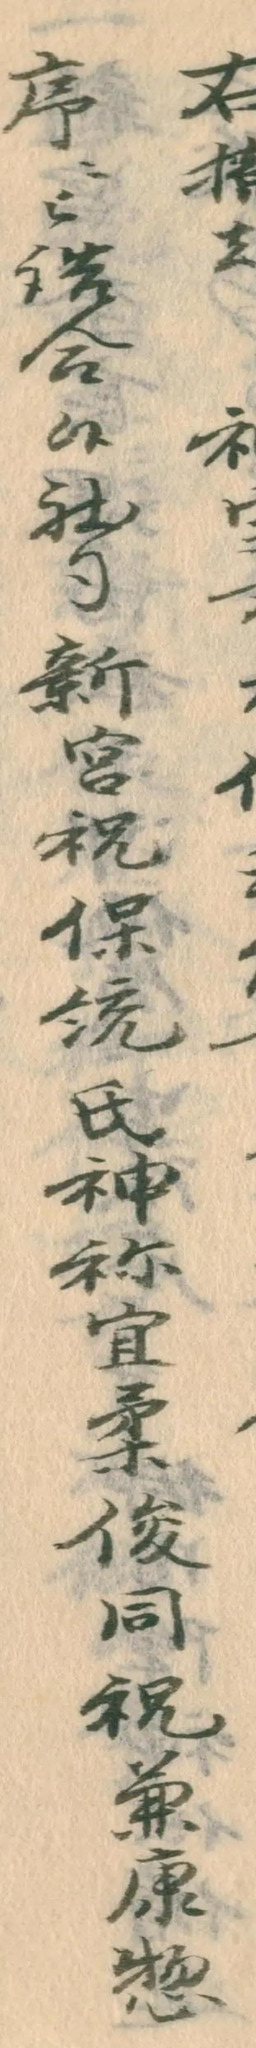序ニ被詰合候社司新宮祝保統氏神祢宜柔俊同祝兼康惣
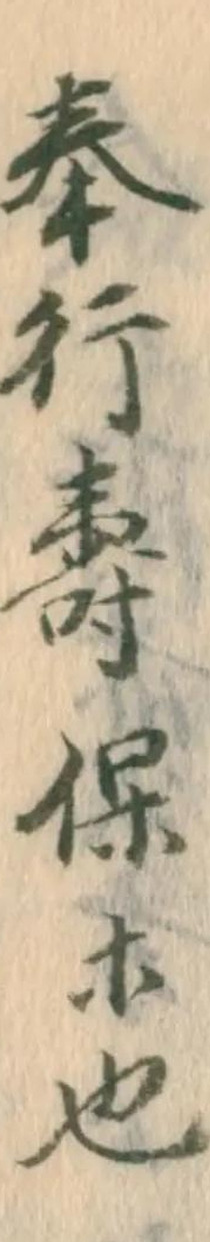奉行寿保等也
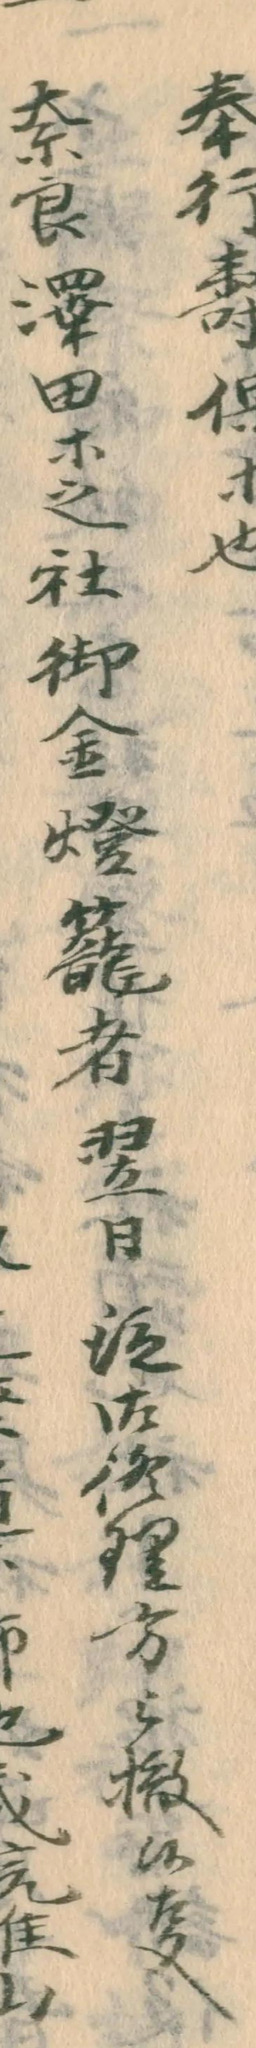一奈良沢田等之社御金燈籠は翌日従御修理方被撤候事
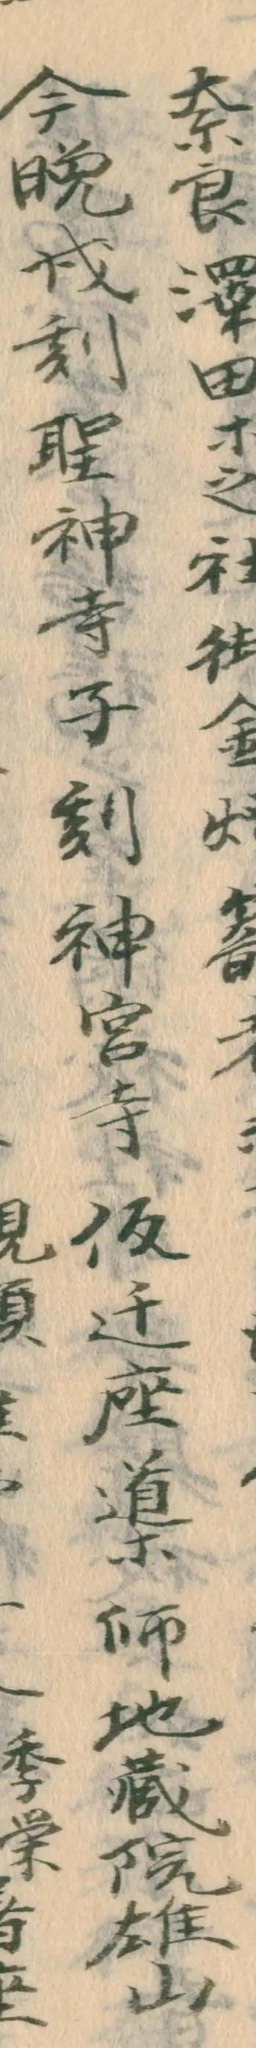一今晩戌刻聖神寺子刻神宮寺仮迁座導師地蔵院雄山
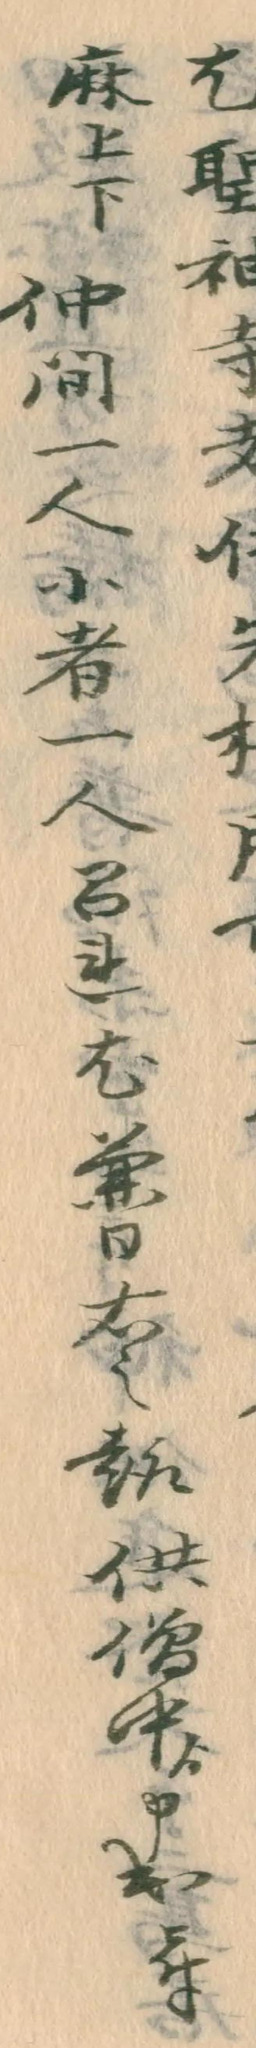麻上下仲間一人小者一人召連尤兼日右之趣供僧中ゟ申出ニ付
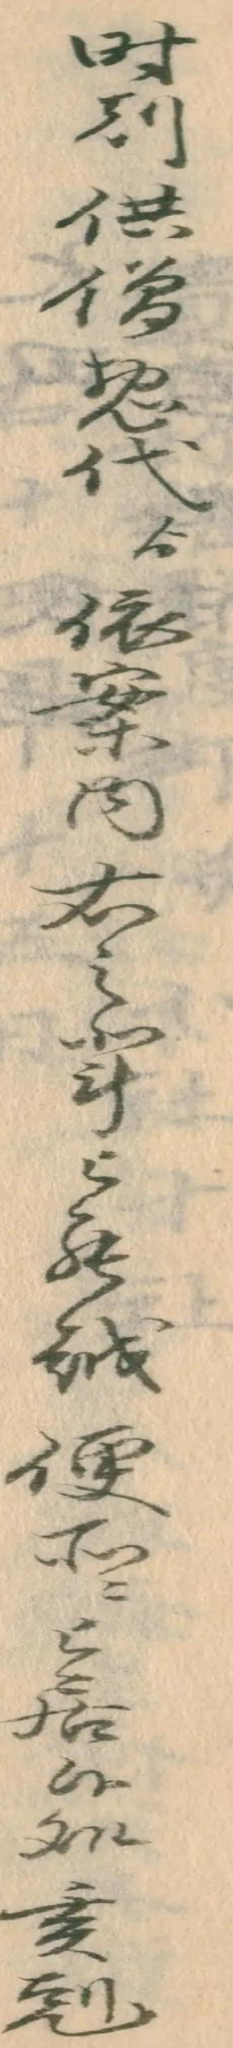時刻供僧惣代ゟ依案内右之輩被罷越便所ニ被居候処亥剋
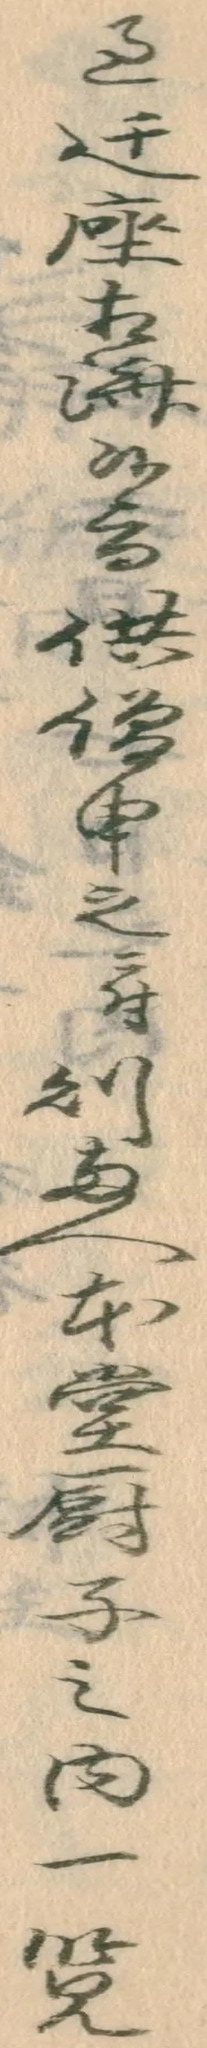過迁座相済候旨供僧申之ニ付則両人本堂厨子之内一覧
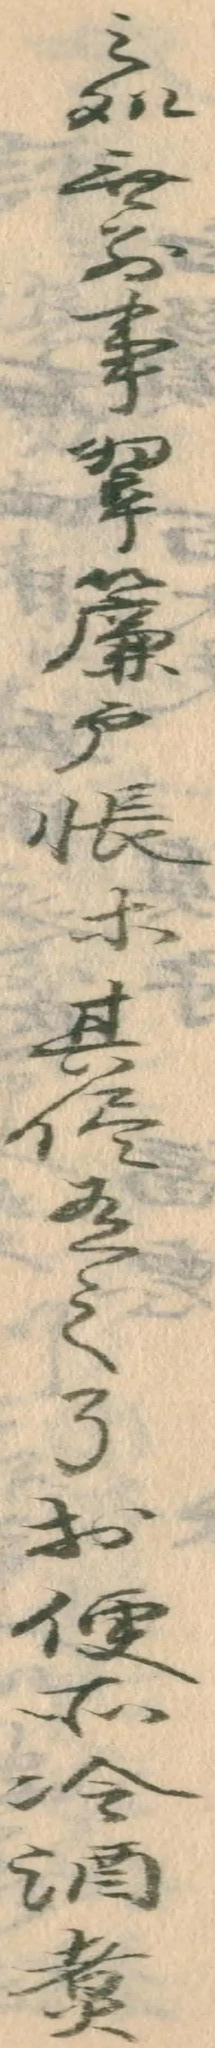之処無別事翠簾戸帳等其侭有之了於便所冷酒煮
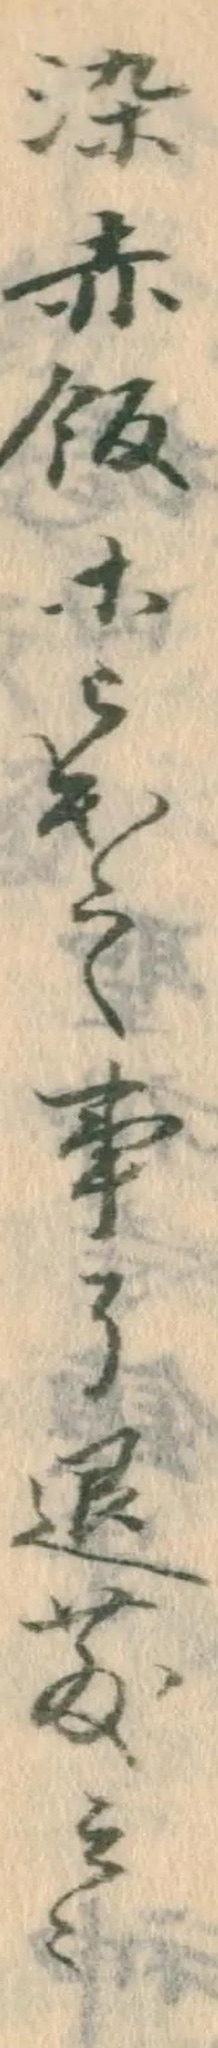染赤飯等被出之事了退散云々
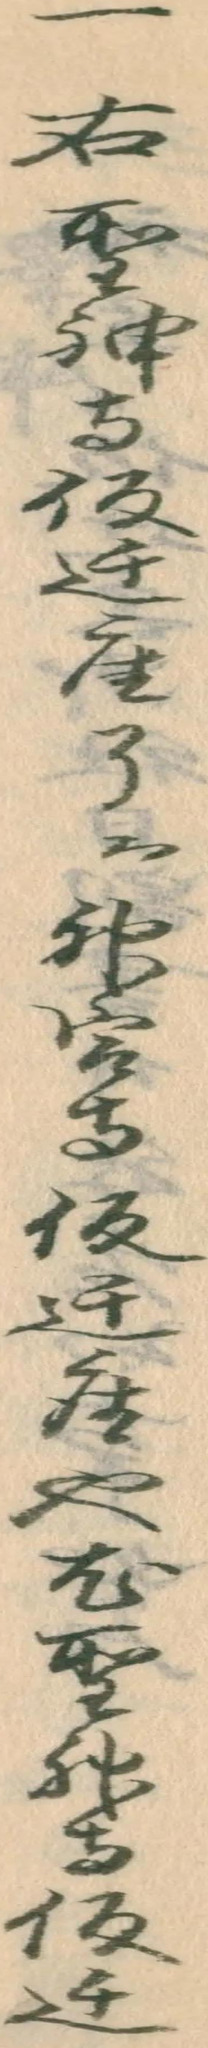一右聖神寺仮迁座了而神宮寺仮迁座也尤聖神寺仮迁
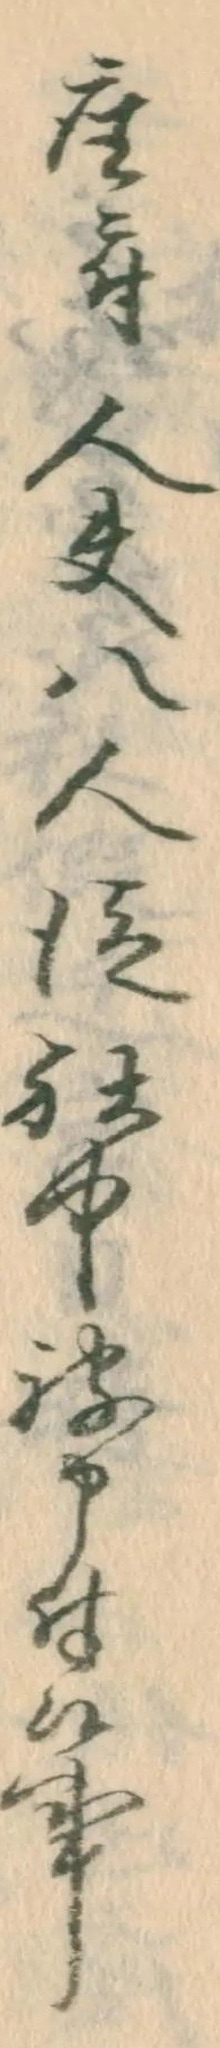座ニ付人夫八人従社中被申付候事
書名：賀茂社記録. 第17冊
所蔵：国立国会図書館 National Diet Library, JAPAN
